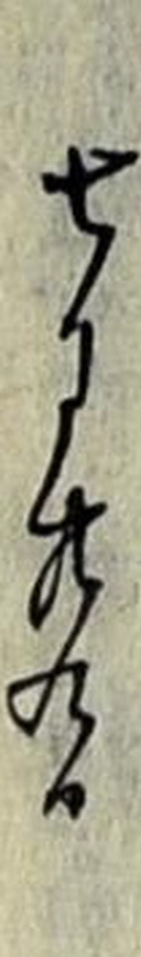七月廿九日
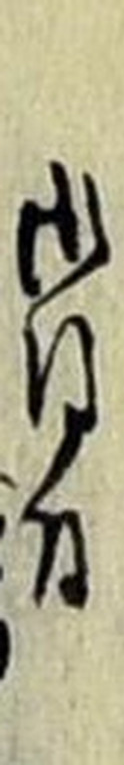御目付
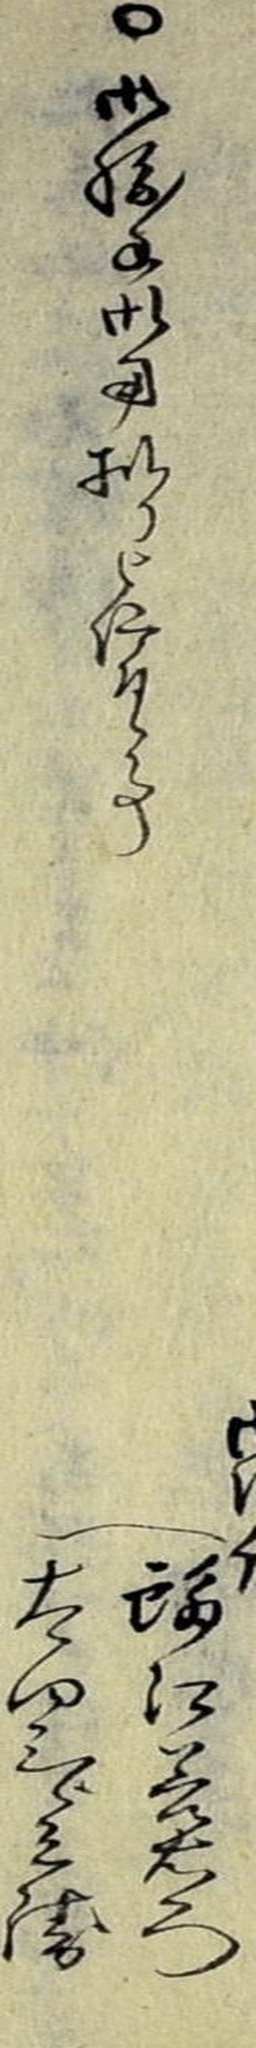〇御勝手御用掛り被仰付候事蠏江善右衛門
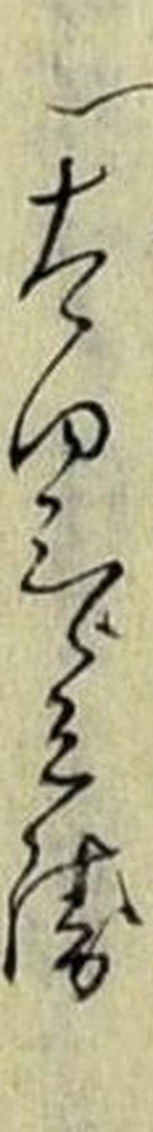太田三郎兵衛
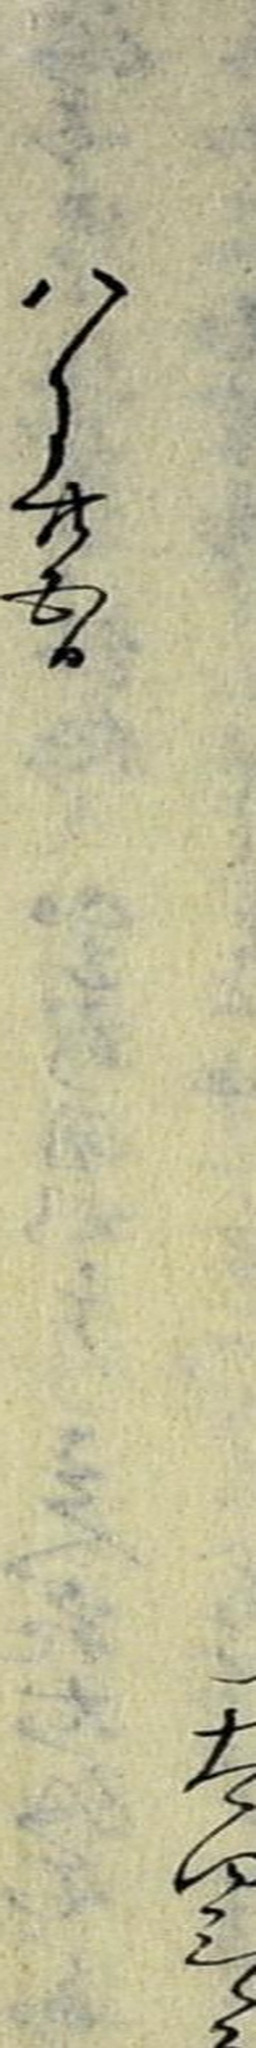八月廿五日
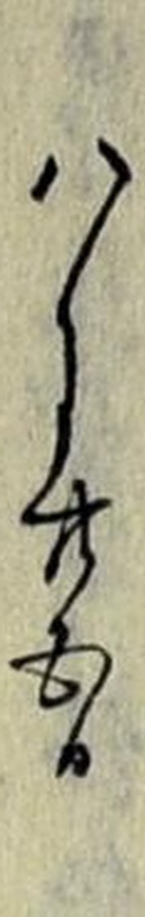八月廿五日
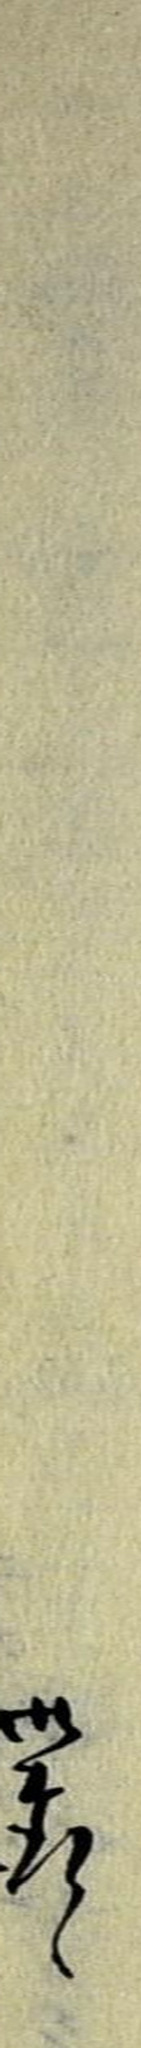御奉行へ
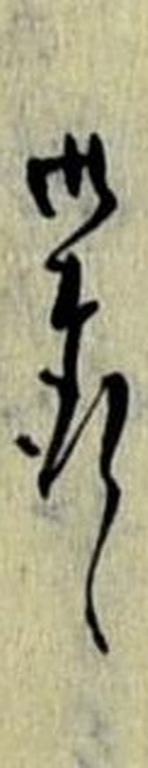御奉行へ
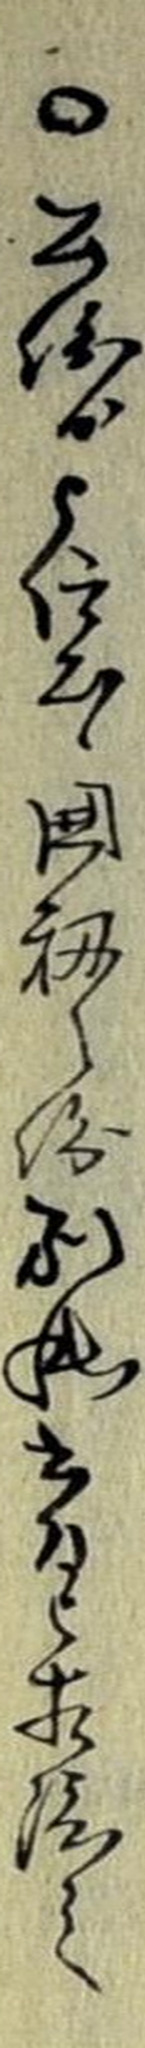〇公儀ゟ被仰出候囲籾之儀別紙書付被相渡之
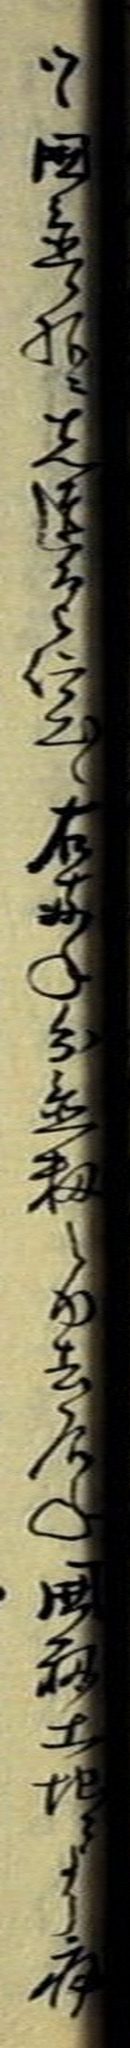ツヽ囲置候様に先達而被仰出候右両年分置籾之内去辰年囲籾土地により病
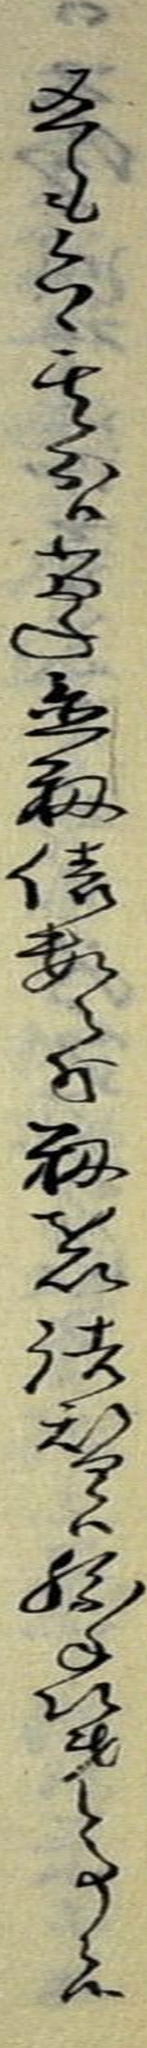有之も候はゝ其分は当年置籾俵数之外籾を以詰替候は勝手次第之事に候
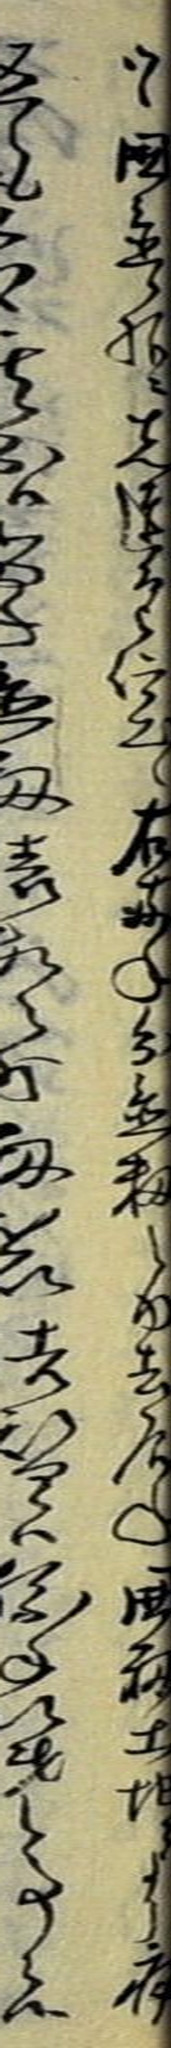有之も候はゝ其分は当年置籾俵数之外籾を以詰替候は勝手次第之事に候
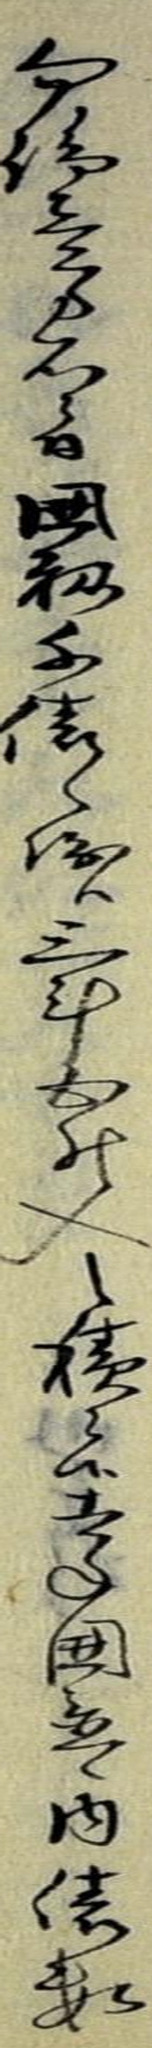勿論壱万石に付囲籾千俵之儀は三斗五升入之積に候去年囲置候内俵数
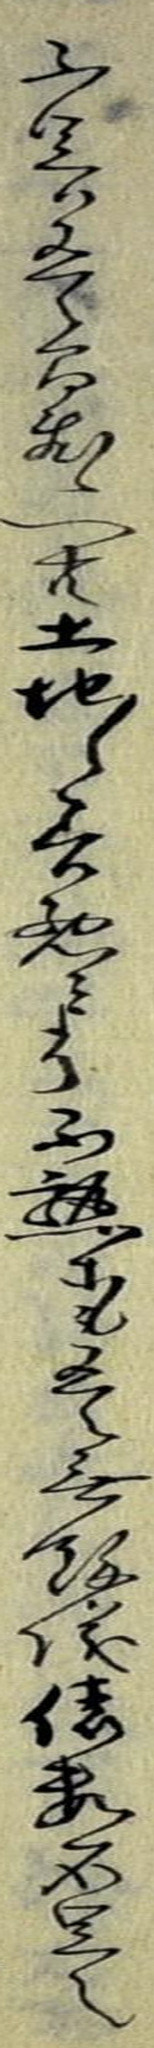不足は有之間敷候へ共土地之善悪により不熟等も有之無余儀俵数不足之
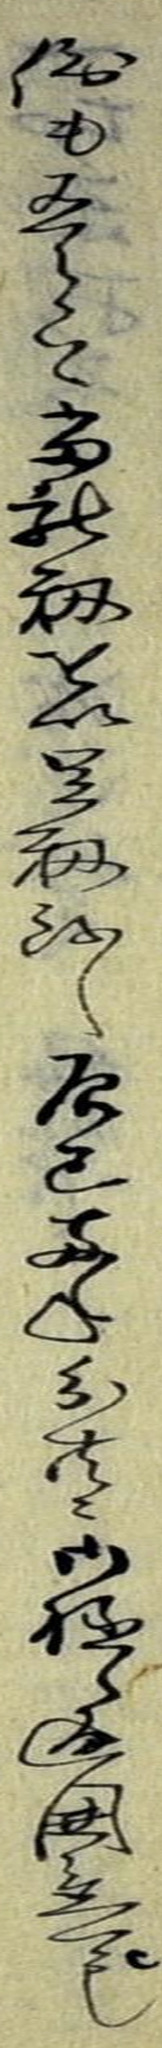儀も有之候はゝ当新籾を以足籾致し辰巳両年分共に御極之通囲置可被申候
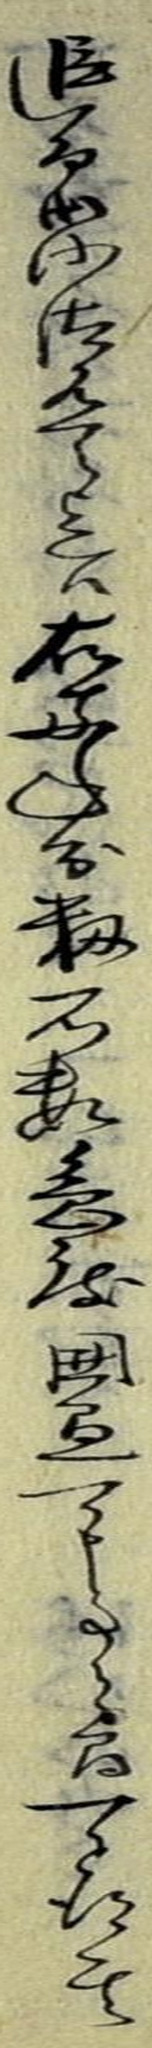追而御沙汰有之迄は右両年分籾石数旧急度囲置可申事に候間可被得其
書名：命令之部 二
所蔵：福井県文書館 Fukui Prefectural Archives
